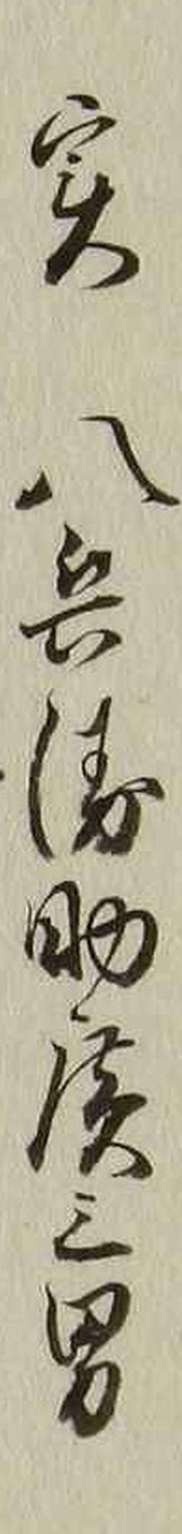実八兵衛助広三男
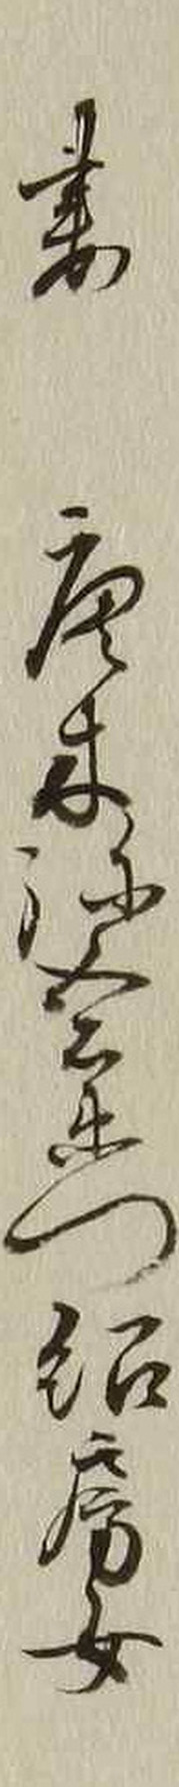妻唐木弥五右衛門紹房女
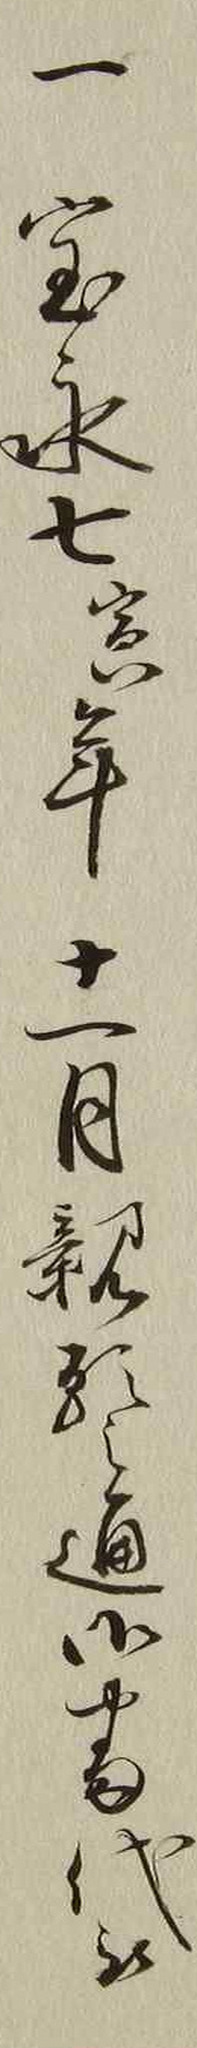一宝永七寅年十一月親願之通御番代被
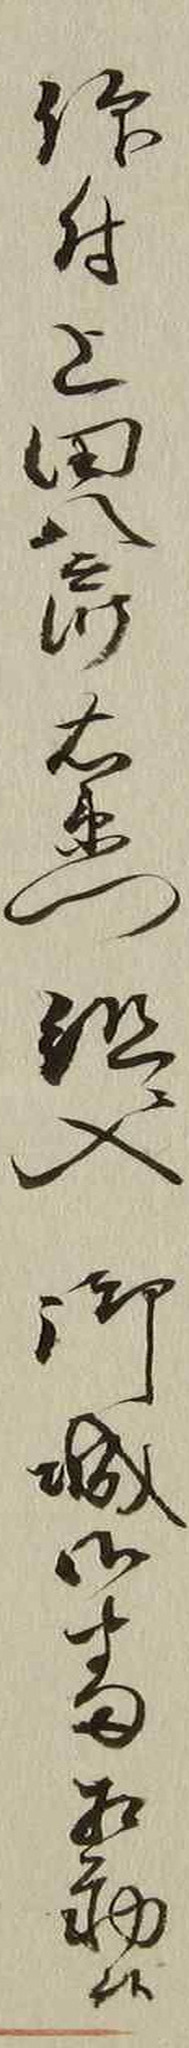仰付上田八郎右衛門組ニ入御城御番相動候
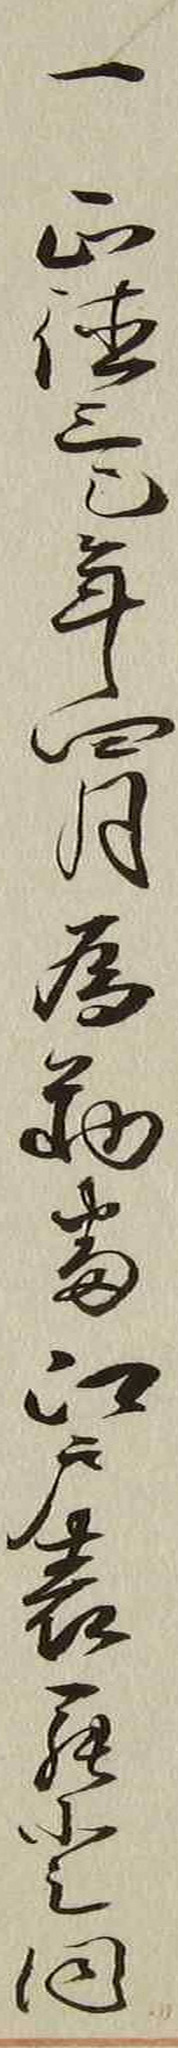一正徳三巳年四月為勤番江戸表罷登同
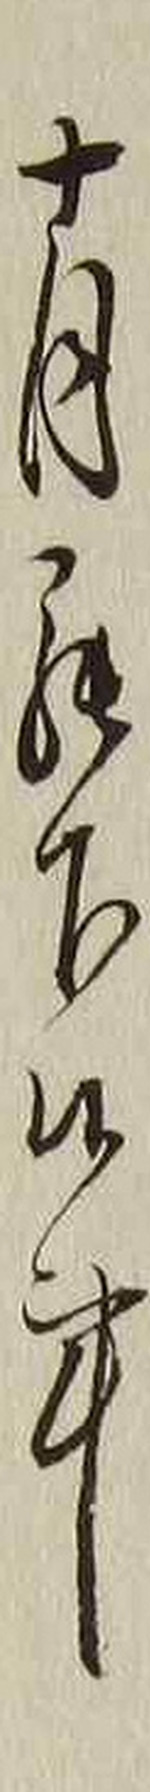十月罷下候事
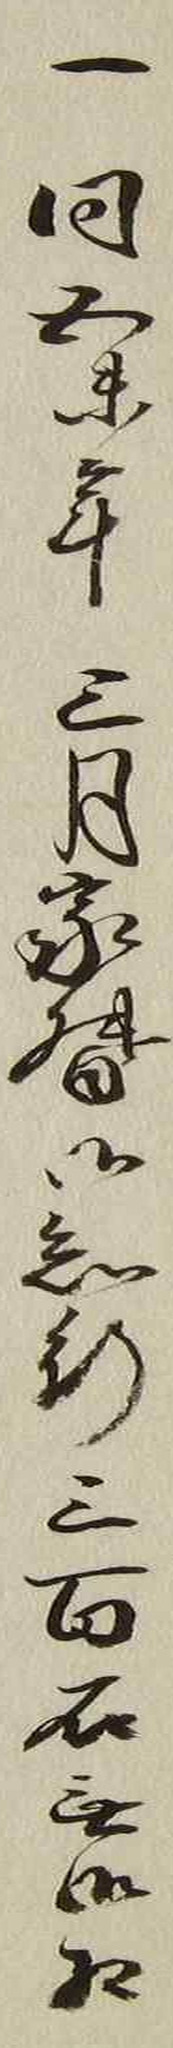一同五未年三月家督御知行三百石無御相
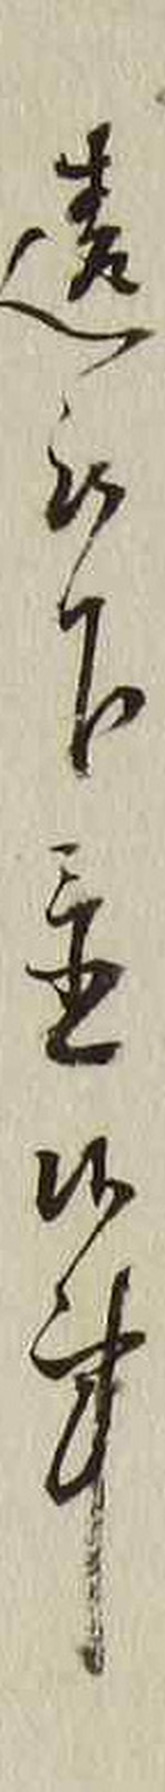違被下置候事
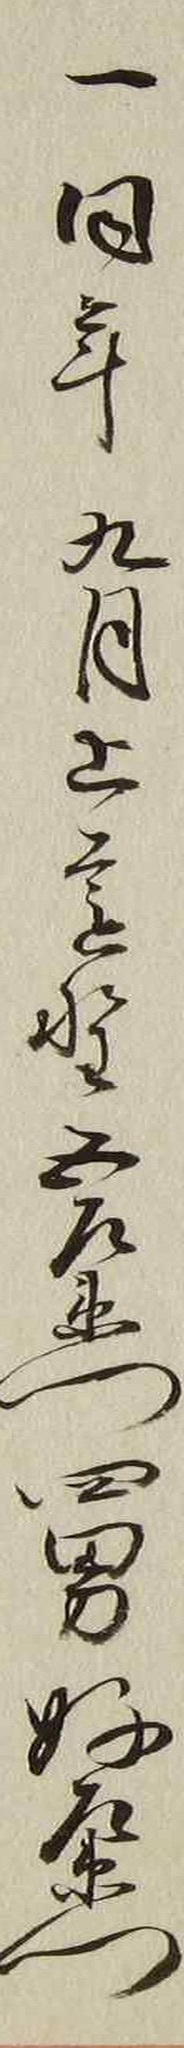一同年九月上遠野五左衛門四男好左衛門
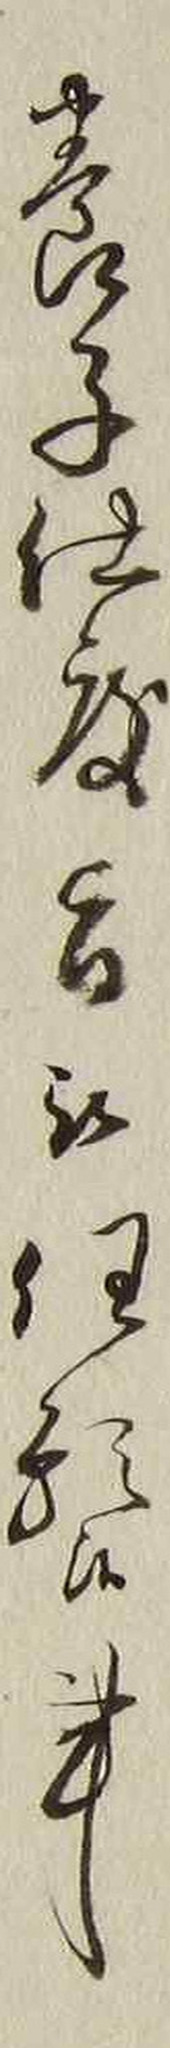養子仕度旨被任願候事
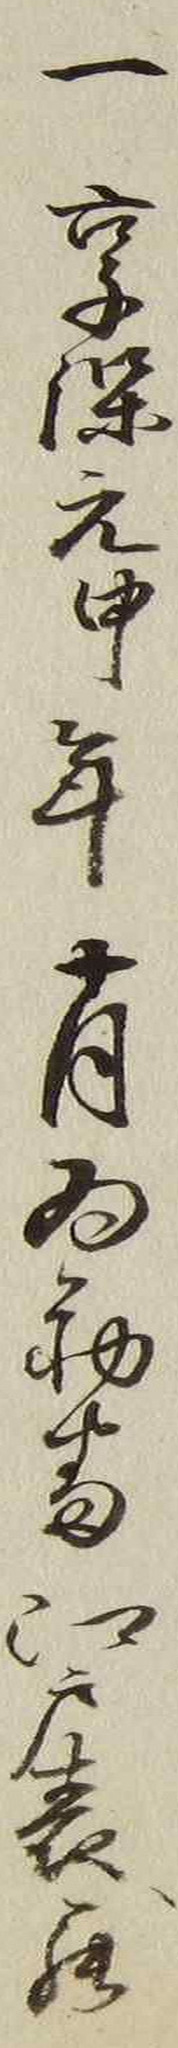一享保元申年十月為勤番江戸表へ罷
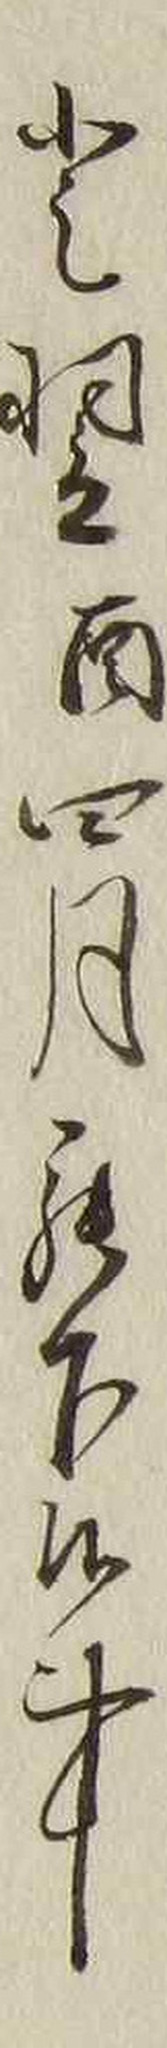登翌酉四月罷下候事
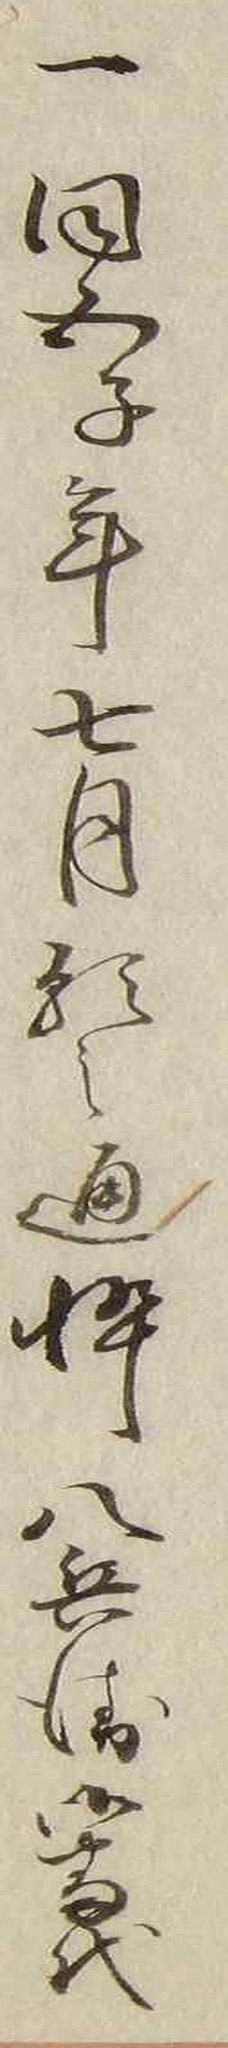一同五子年七月願之通忰八兵衛御番代

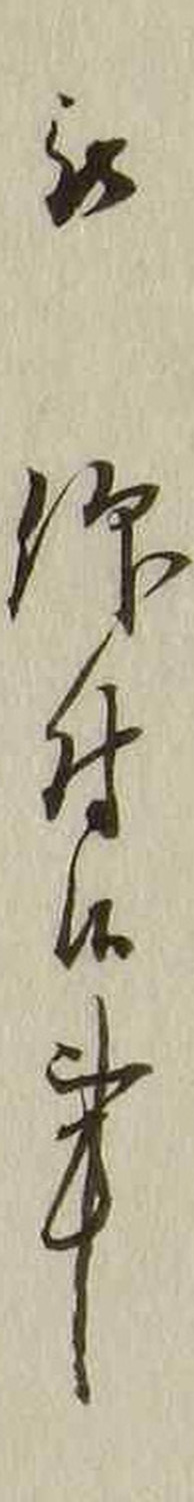被仰付候事
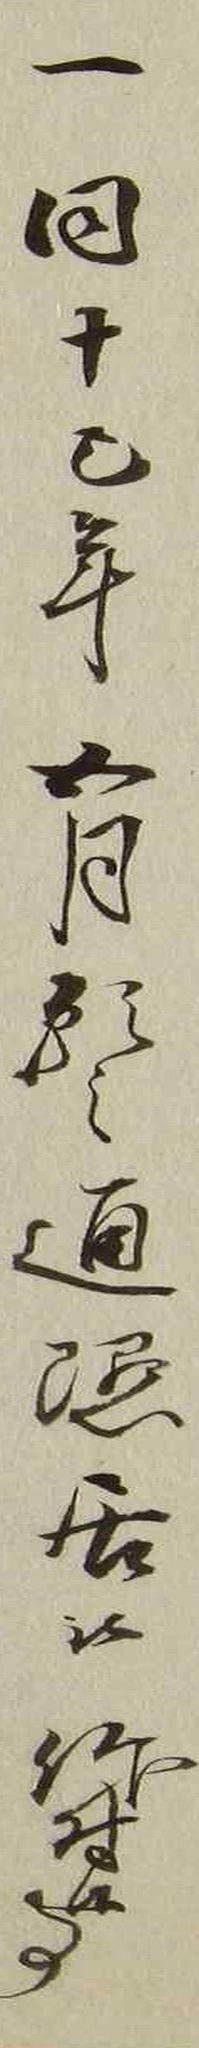一同十巳年五月願之通隠居被仰付候事
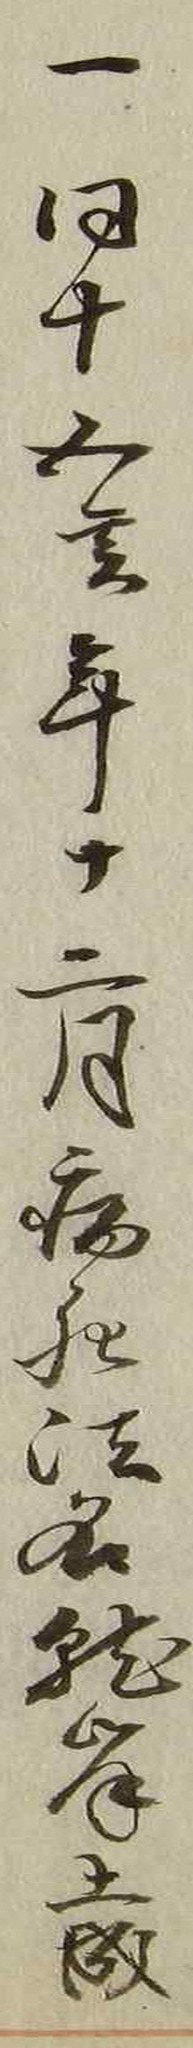一同十五亥年十二月病死法名就岸土成
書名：諸士系譜　巻之122　よ之部5
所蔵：会津若松市立会津図書館
